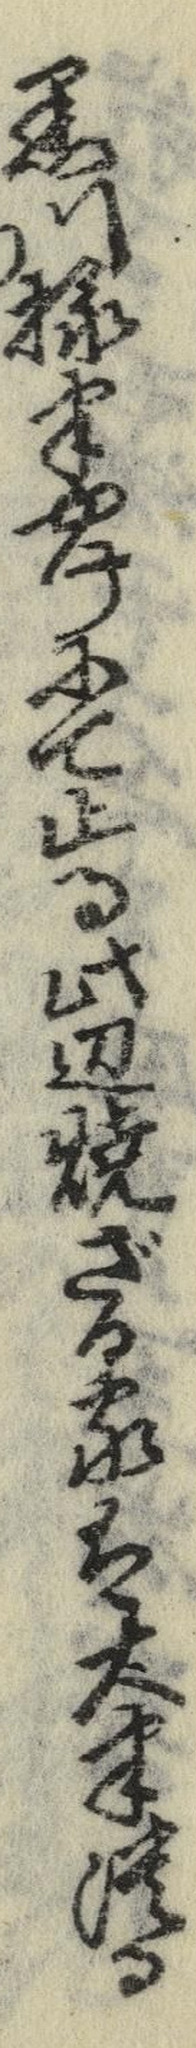黒川様半やけにて止る此辺焼ざる家は大半潰る
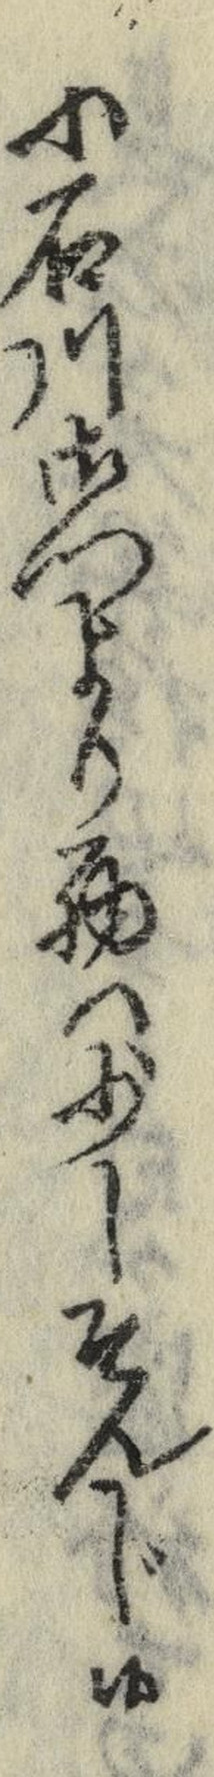小石川御門より西は少しそんじ候
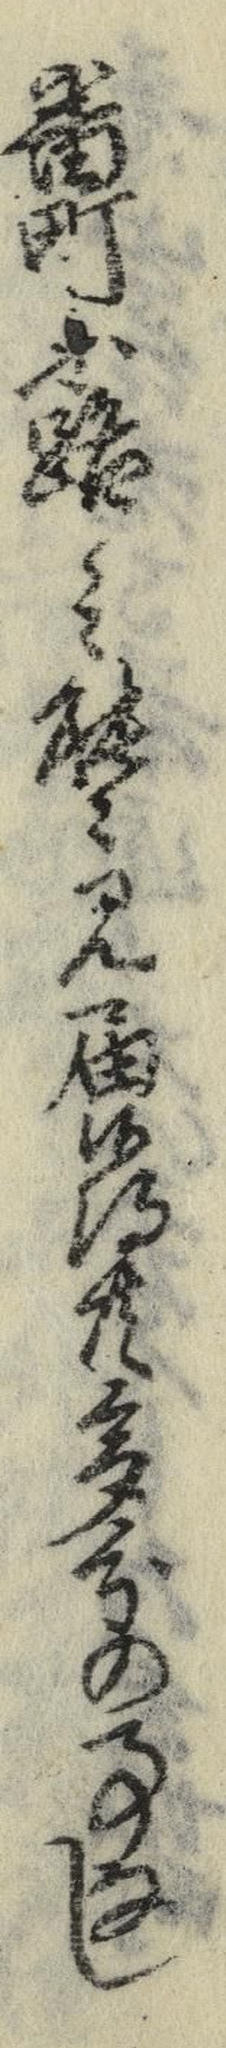番町小路々々能々見届候得共多分の事なし
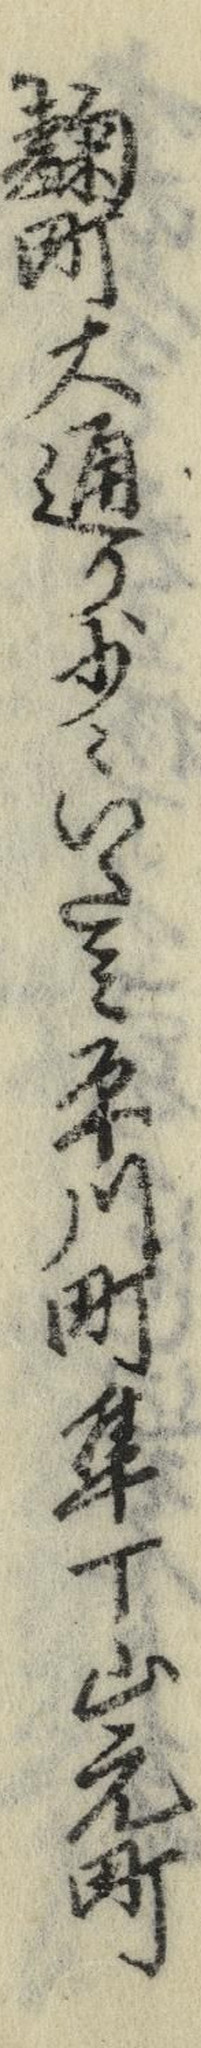麹町大通り少々いたみ平川町隼丁山元町
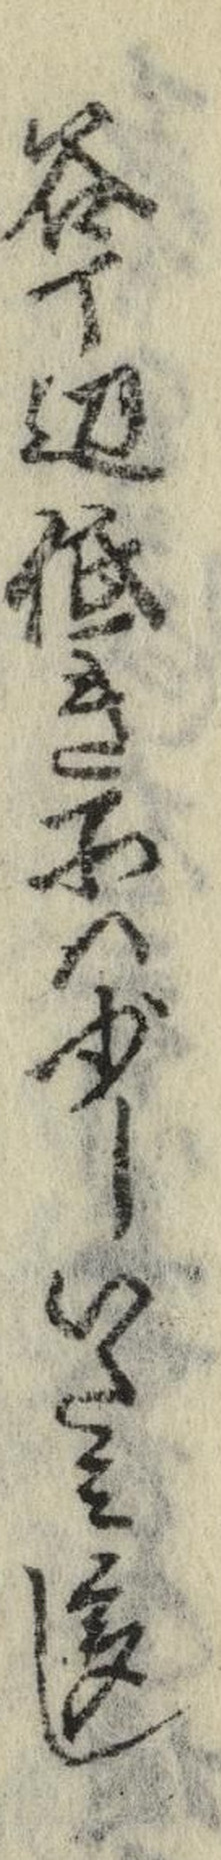谷丁辺低き所は少しいたみ多し
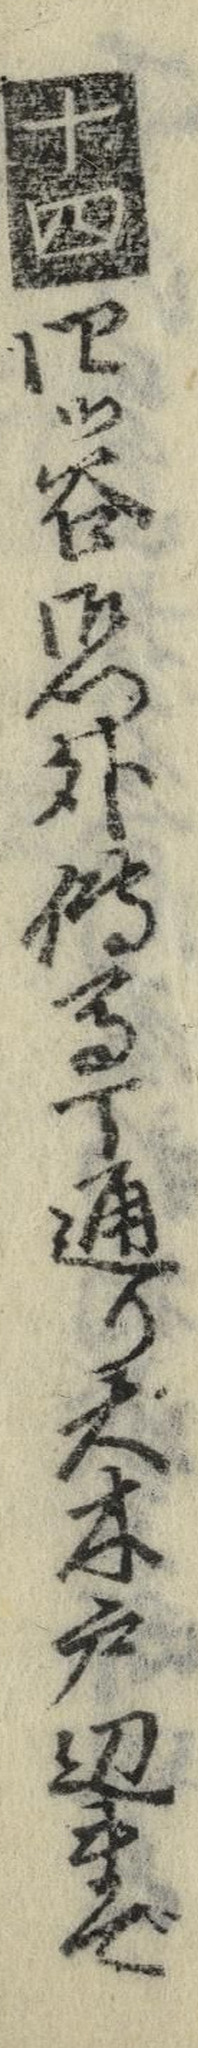十四四ツ谷御門は外伝馬丁通り大木戸辺まで

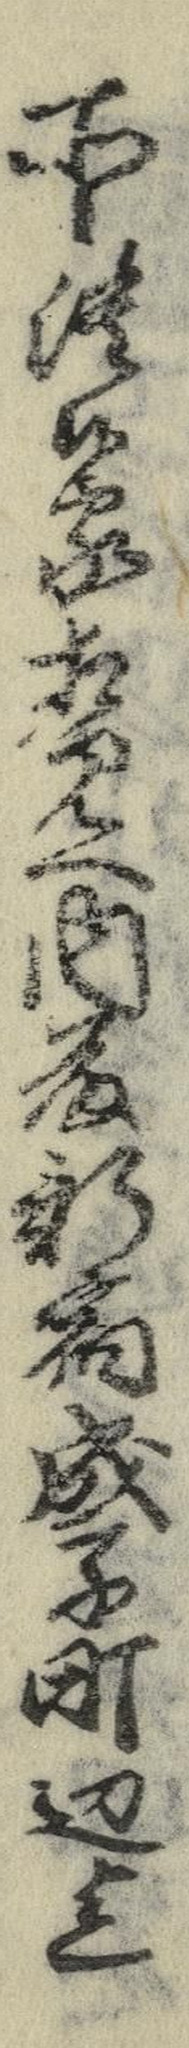所々潰候家相見へ内藤新宿成子町辺迄
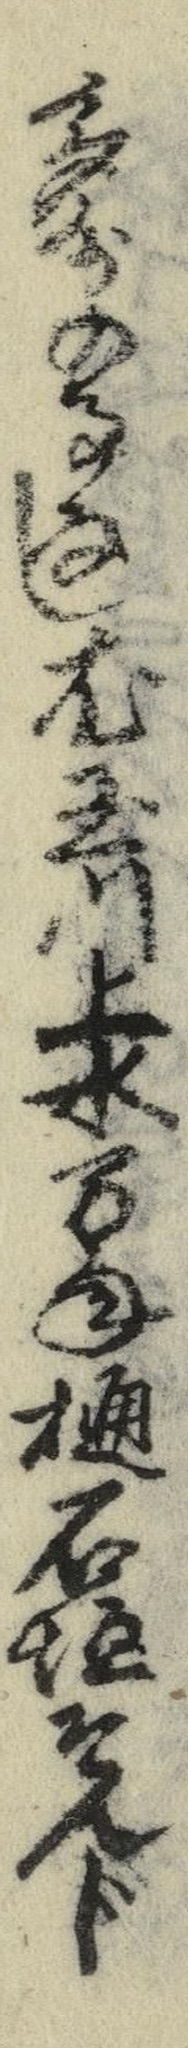多分の事なし尤玉川上水万年樋石垣そんじ
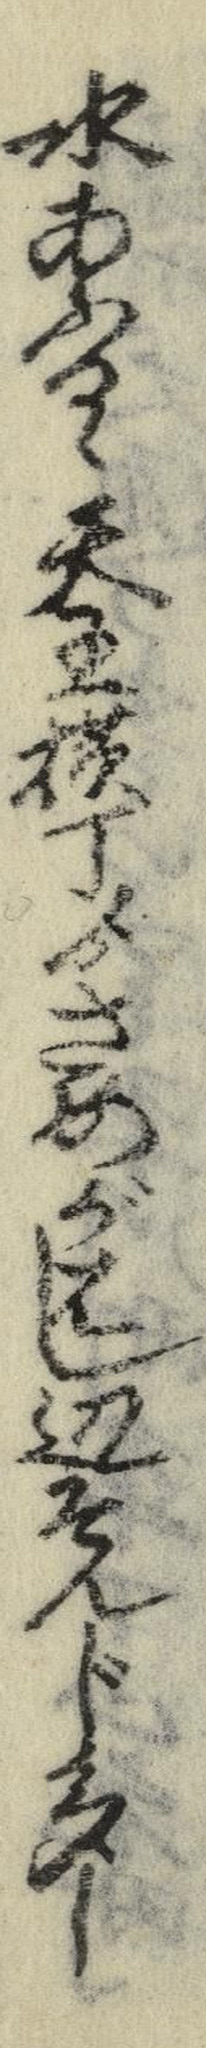水あふるゝ天王横丁ゟさめがはし辺そんじ多し
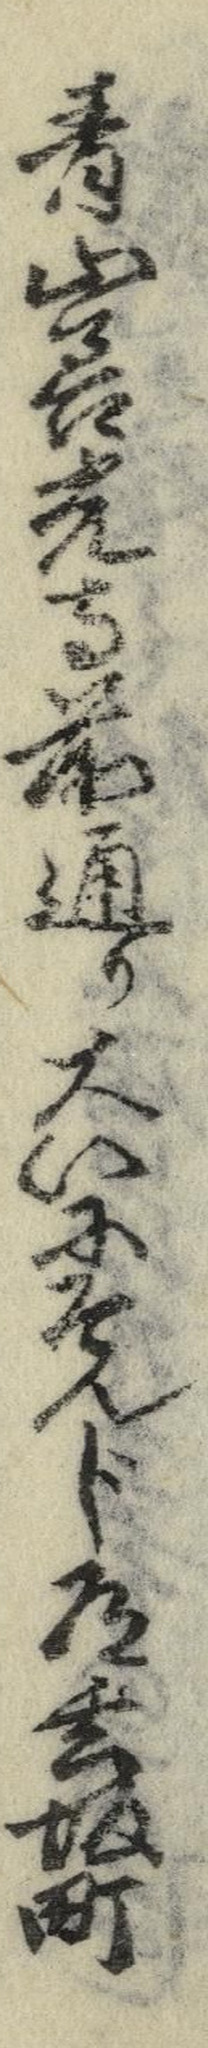青山善光寺前通り大いにそんじ道玄坂町
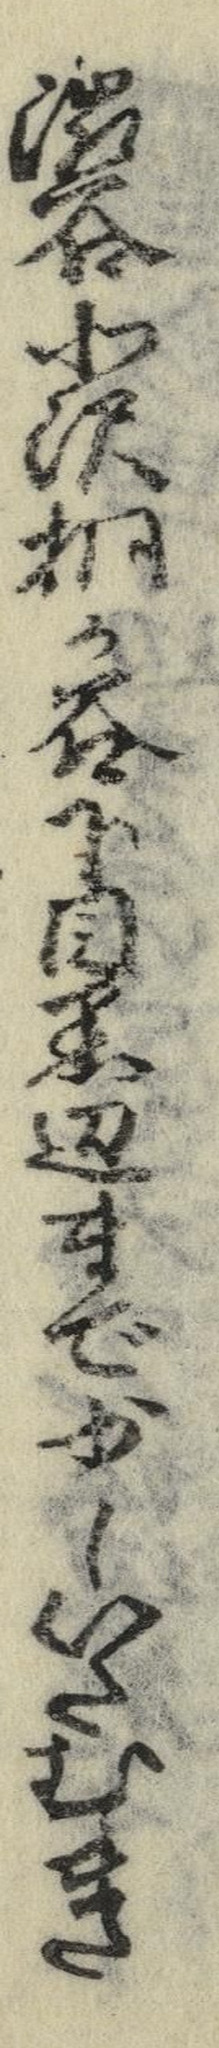渋谷北沢桐か谷下目黒辺まで少しいたむまた
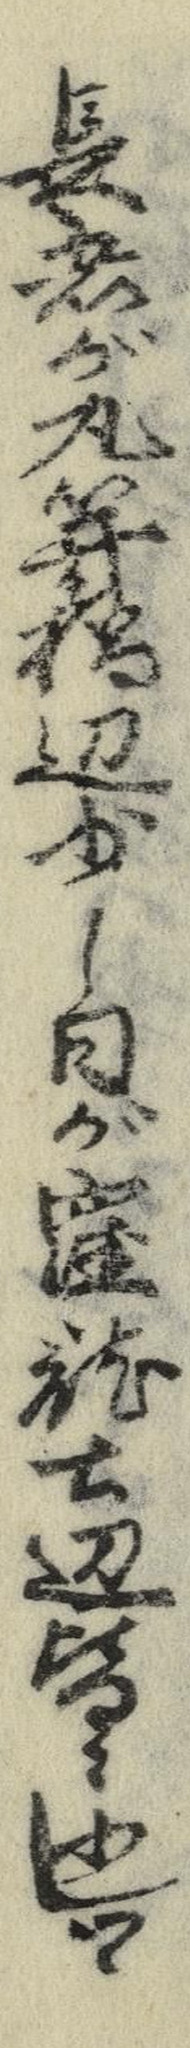長者が丸笄橋辺少し日が窪龍土辺皆々少しつゝ
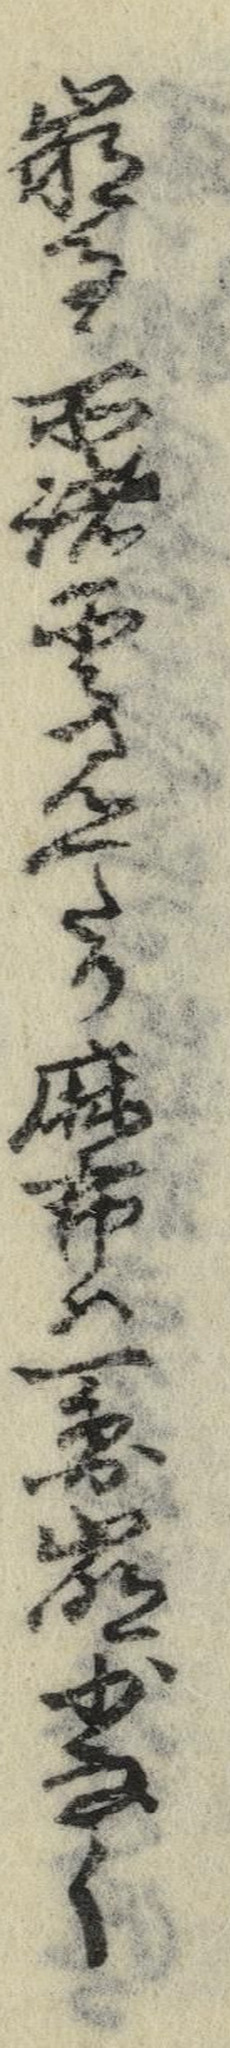崩るゝ所諸所々見へたり麻布は一円崩少なく
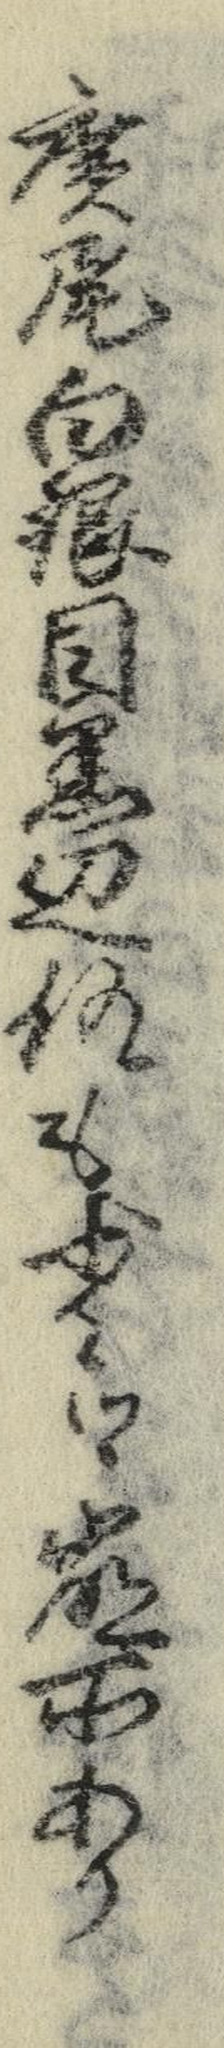廣尾白銀目黒辺何も少々つゝ崩所あり
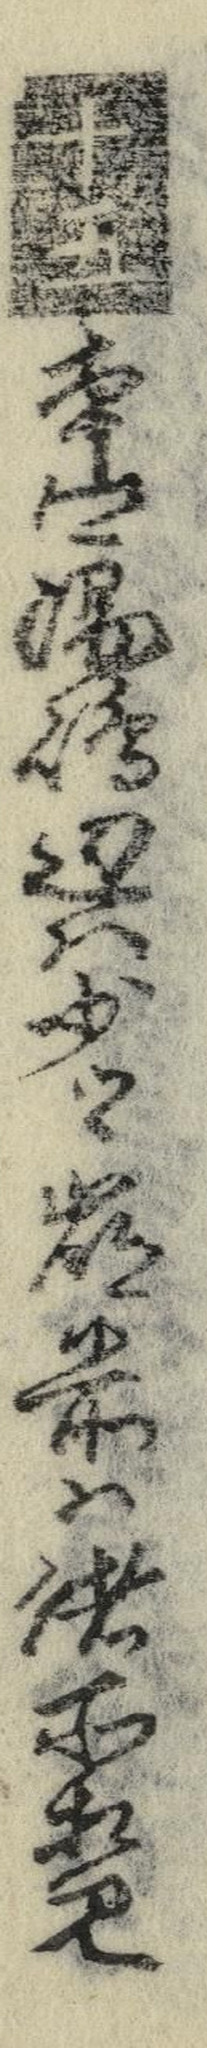十五本郷湯嶋辺は少々崩候所は諸所相見
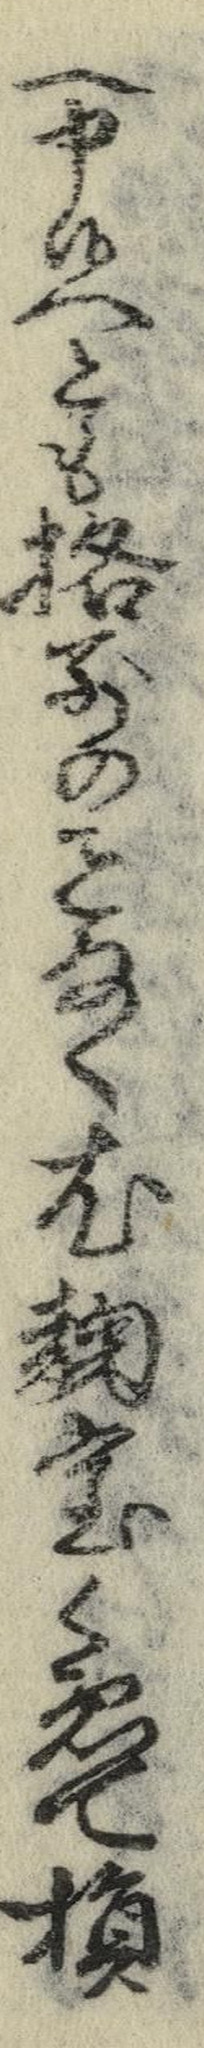へ申候へとも格別のことなく尤麹室くゑて損
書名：地震類焼場所明細書之写　安政二卯年十月二日夜四ツ時過　御府内御屋敷方市中共、并街道筋近郷聞書
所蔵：東京大学地震研究所図書室 Earthquake Research Institute Library, The University of Tokyo, JAPAN
